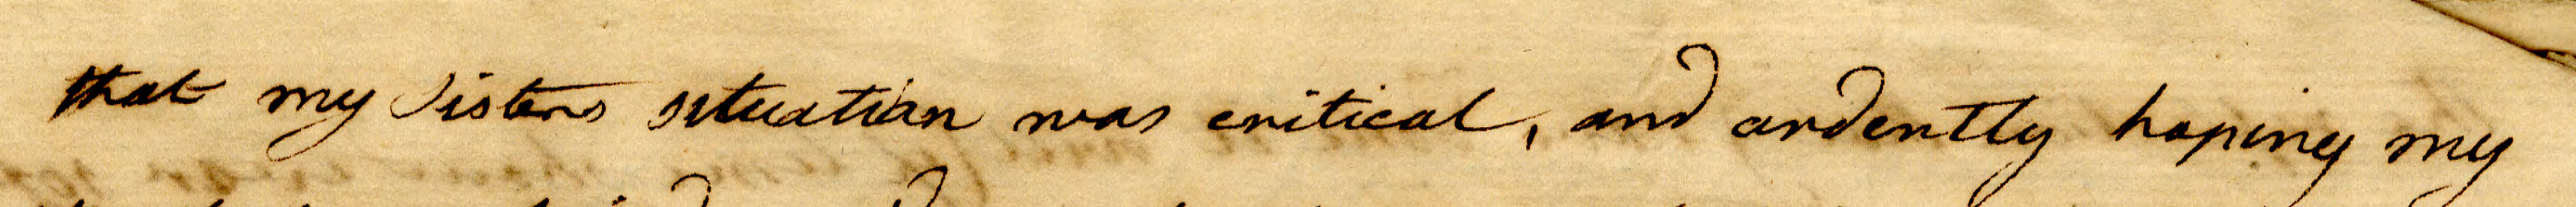that my sisters situation was critical, and ardently hoping my
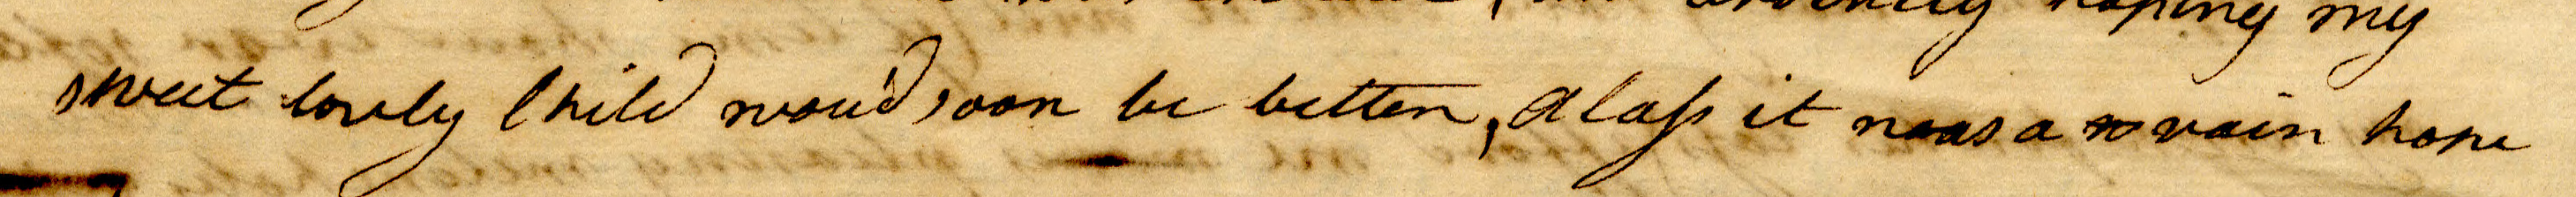sweet lovly child wou'd soon be better, Alass it was a vain hope
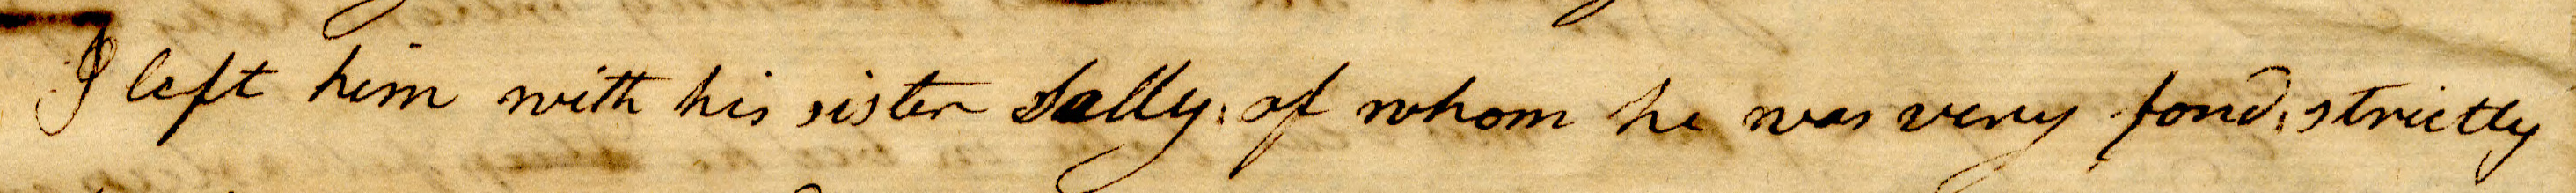I left him with his sister Sally: of whom he was very fond, strictly
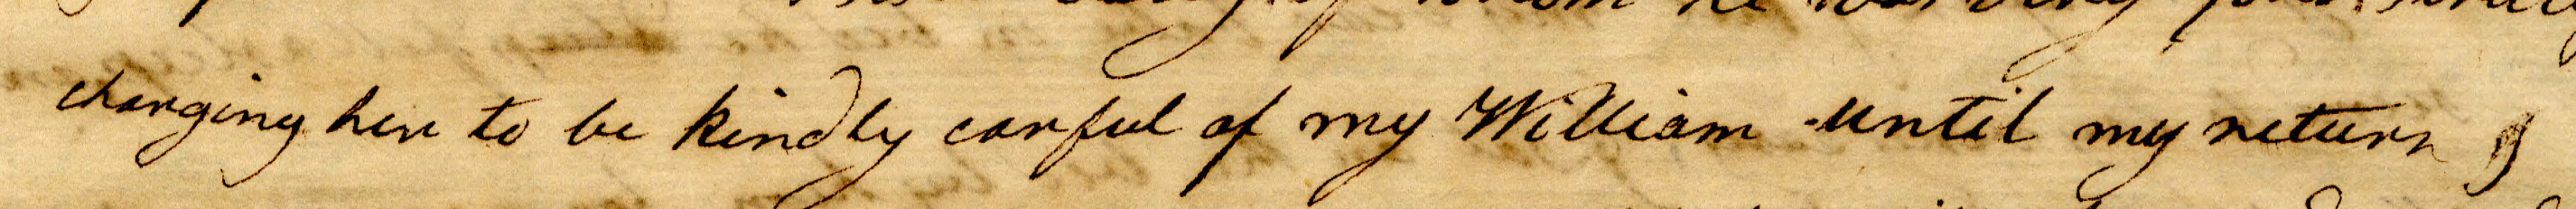charging her to be kindly carful of my William until my return I
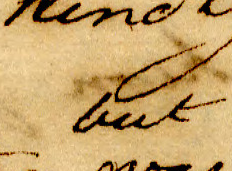but
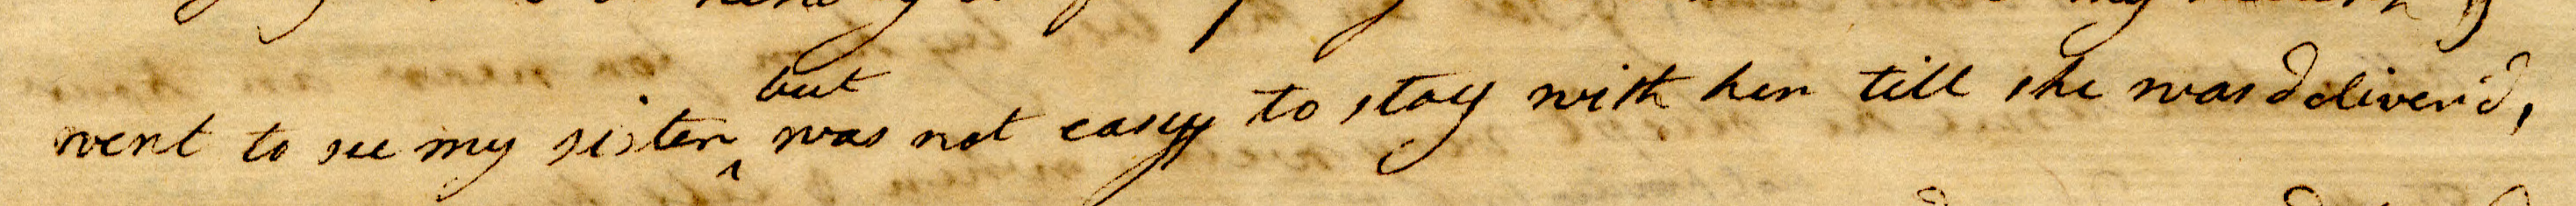went to see my sister ^ was not easy to stay with her till she was deliver'd,
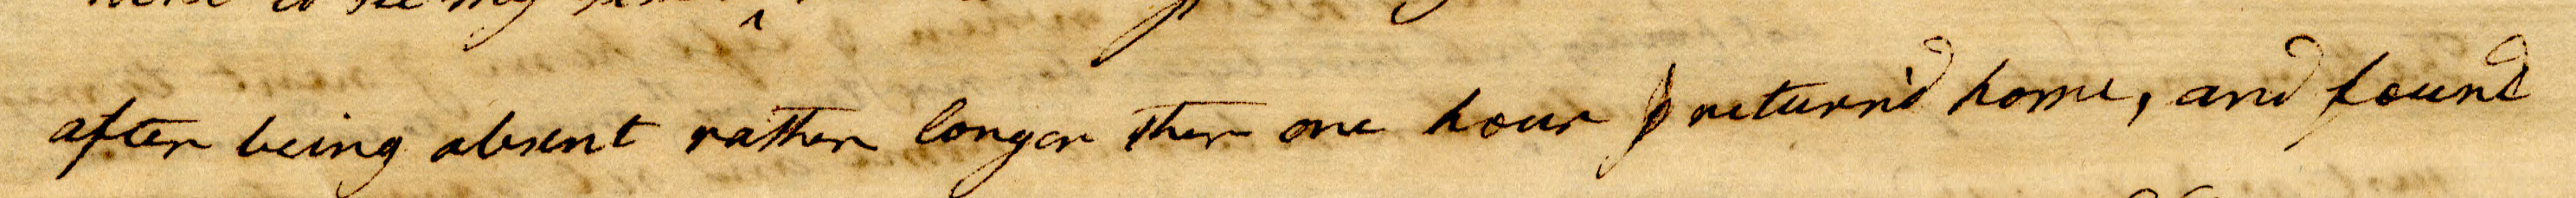after being absent rather longer than one hour I return'd home, and found
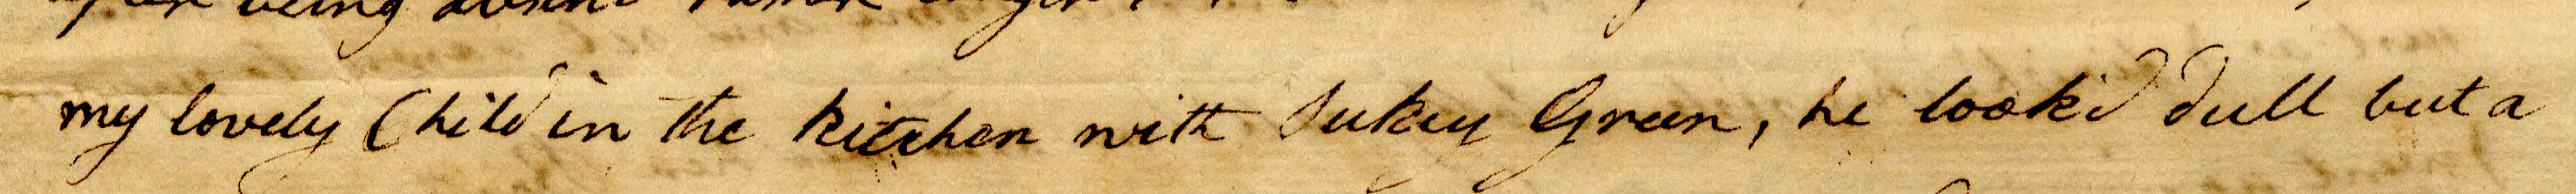my lovely Child in the kitchen with Sukey Green, he look'd dull but a
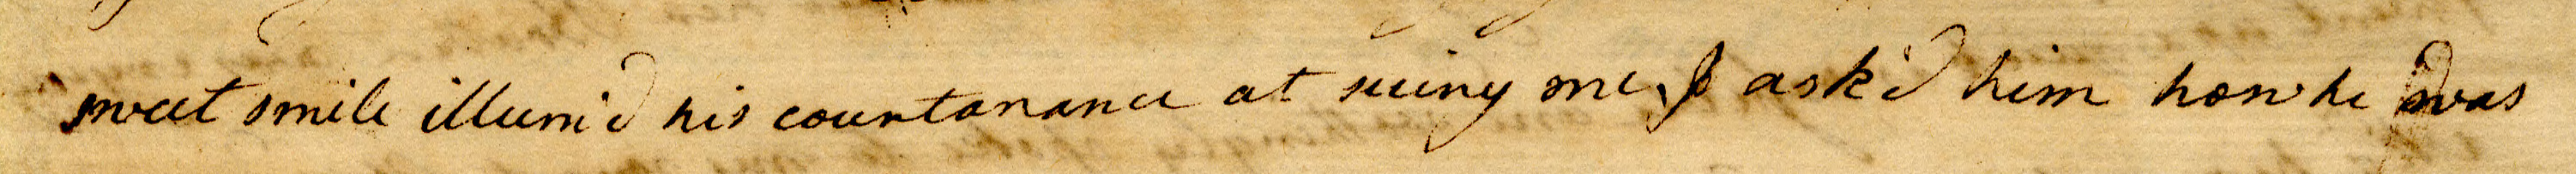sweet smile illum'd his countanance at seeing one, I ask'd him how he was
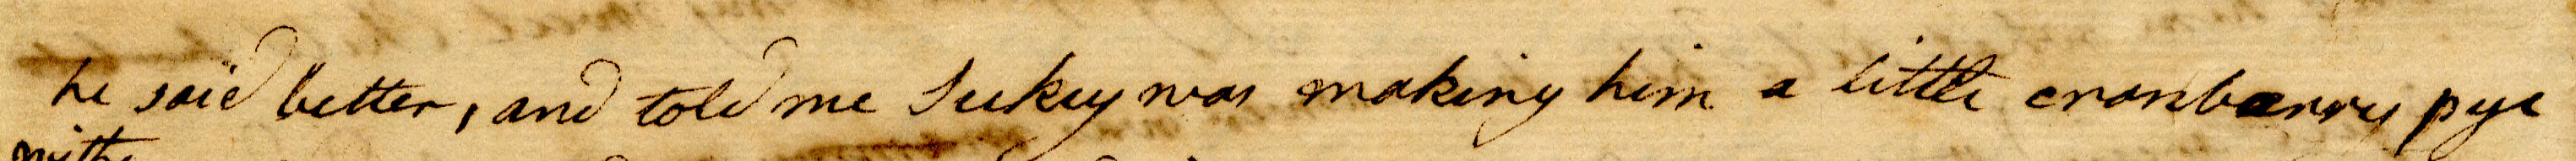he said better, and told me Sukey was making him a little cranberry pye
